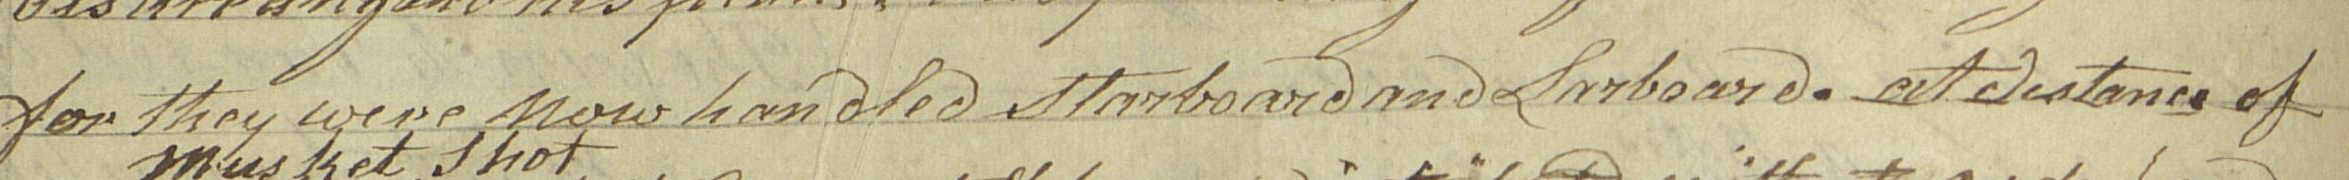for they were now handled starboard and Sarboard at Distance of
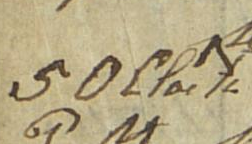5 O Clock
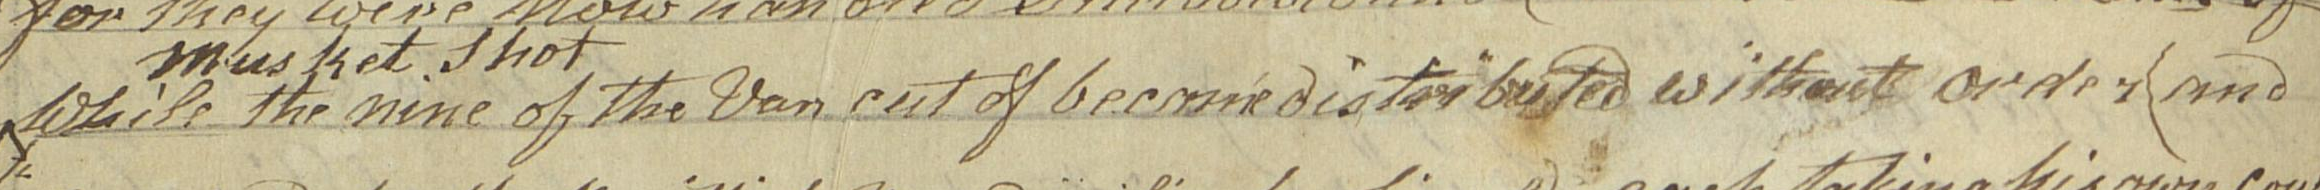While the nine of the Van cut of became distributed without order (and
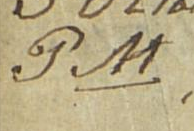PM
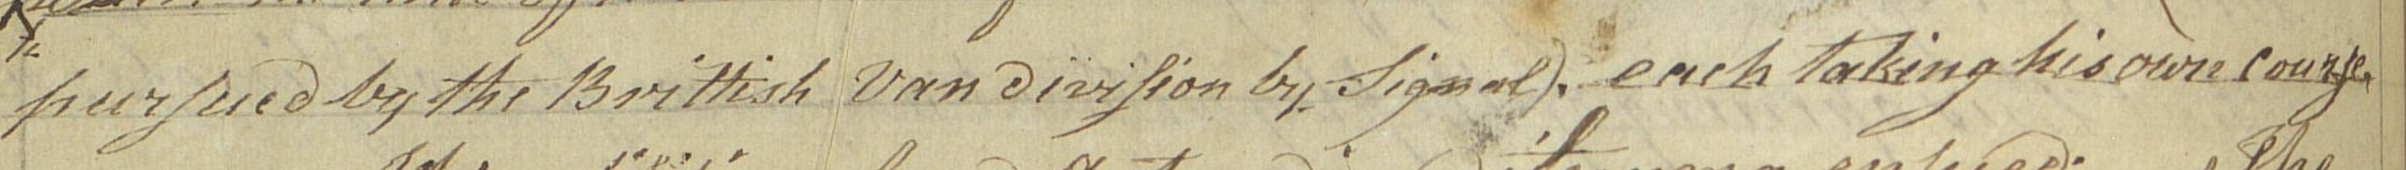pursued by the Brittish Van division by Signal), each taking his own course,
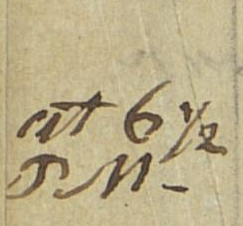at 6 1/2
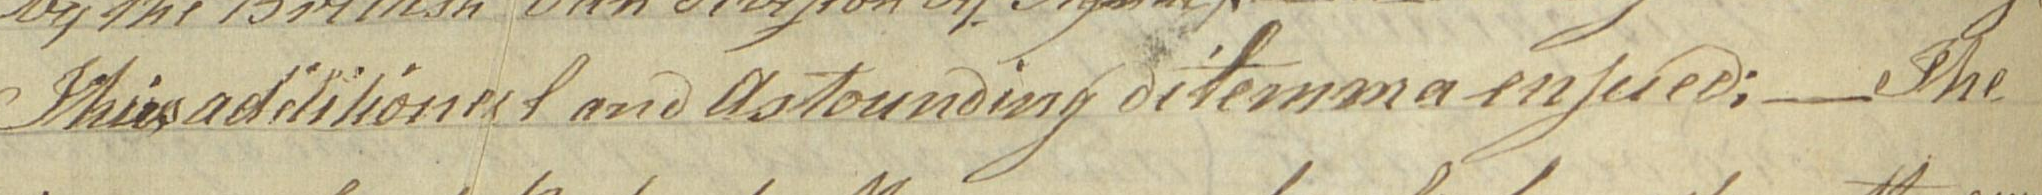Thus additional and Astounding dilemma ensued; The
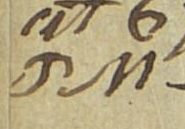PM
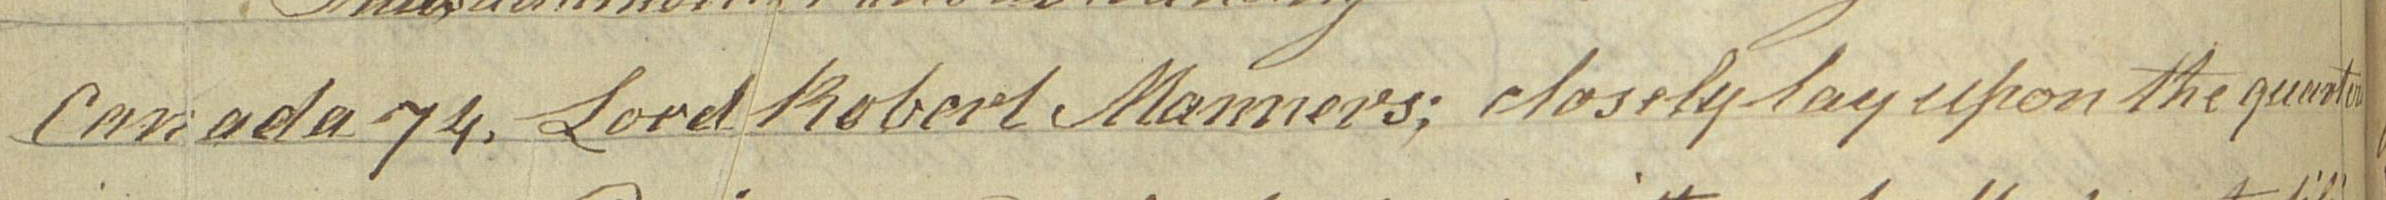Canada 74, Lord Robert Manners; closely lay upon the quarter
